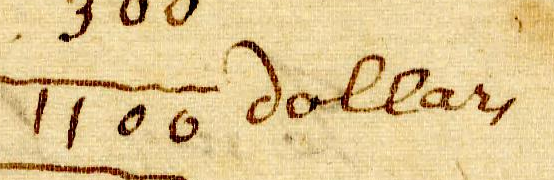1100 dollars
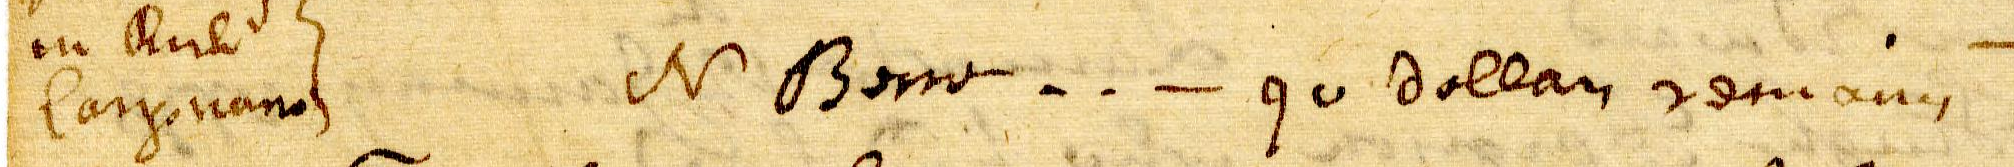Carys man N Bems-.- 90 dollars remains
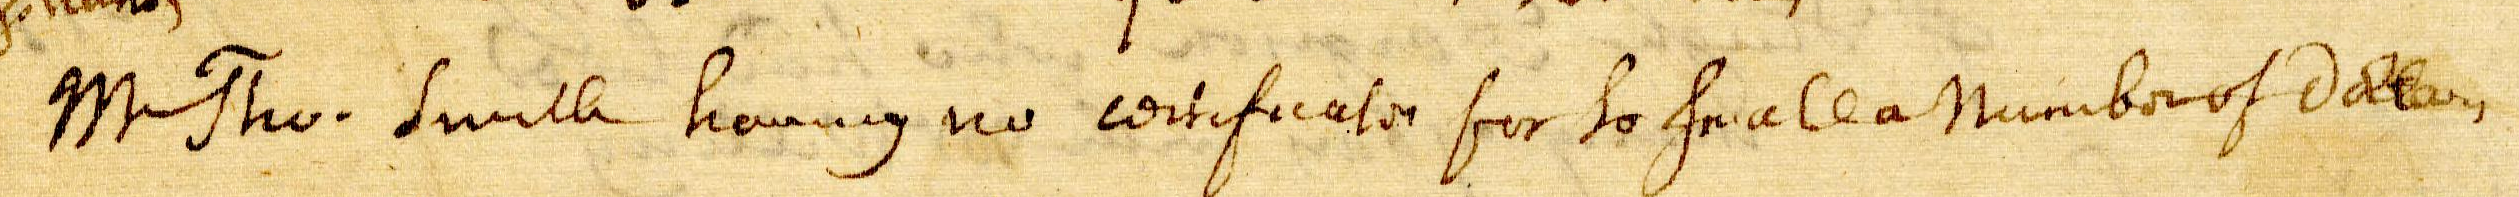Mr Tho. Smith having no certificates for so small a Number of dollars,
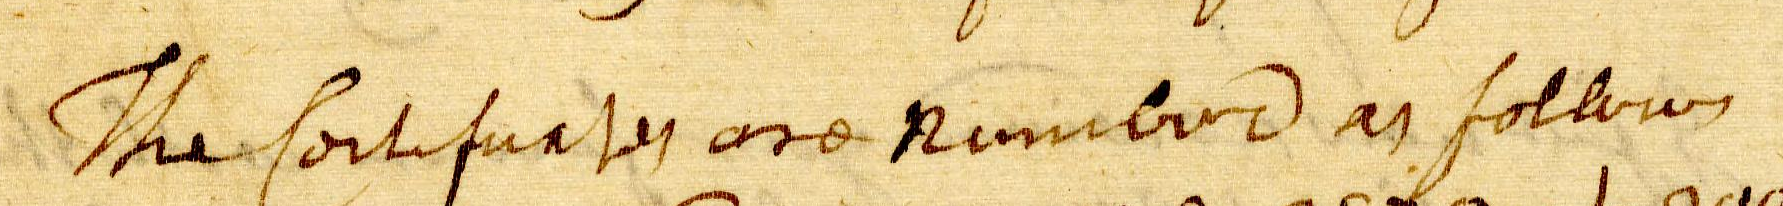The Certificates are numberd as follows
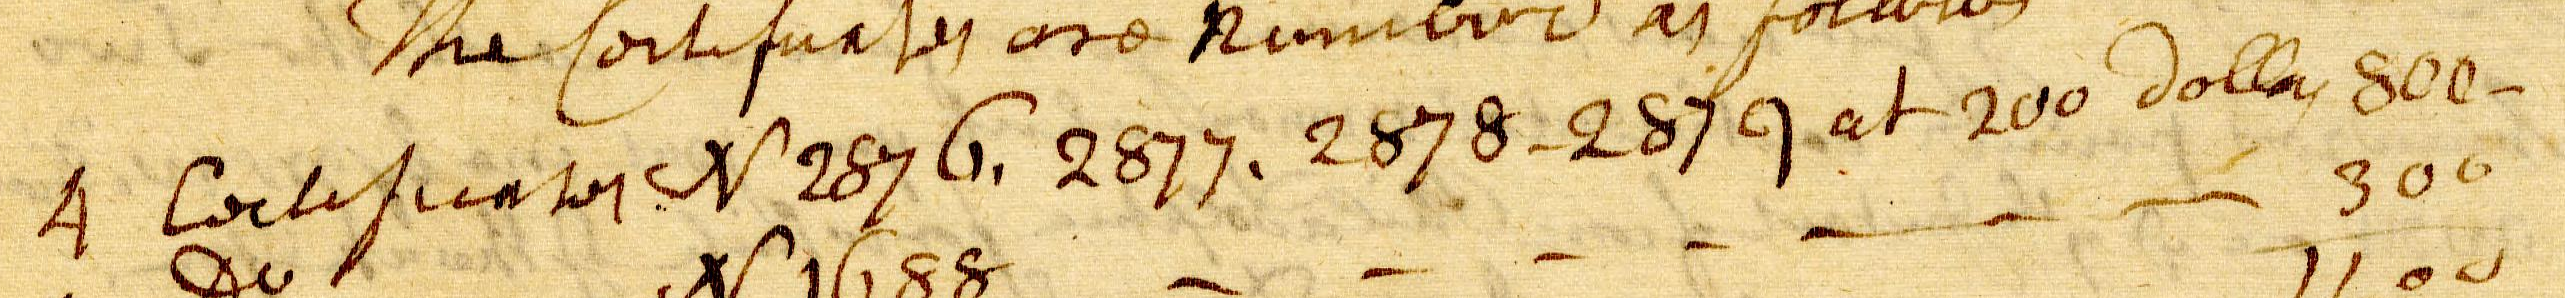4 Certificates. N2876. 2877. 2878. 2879 at 200 dollars 800-
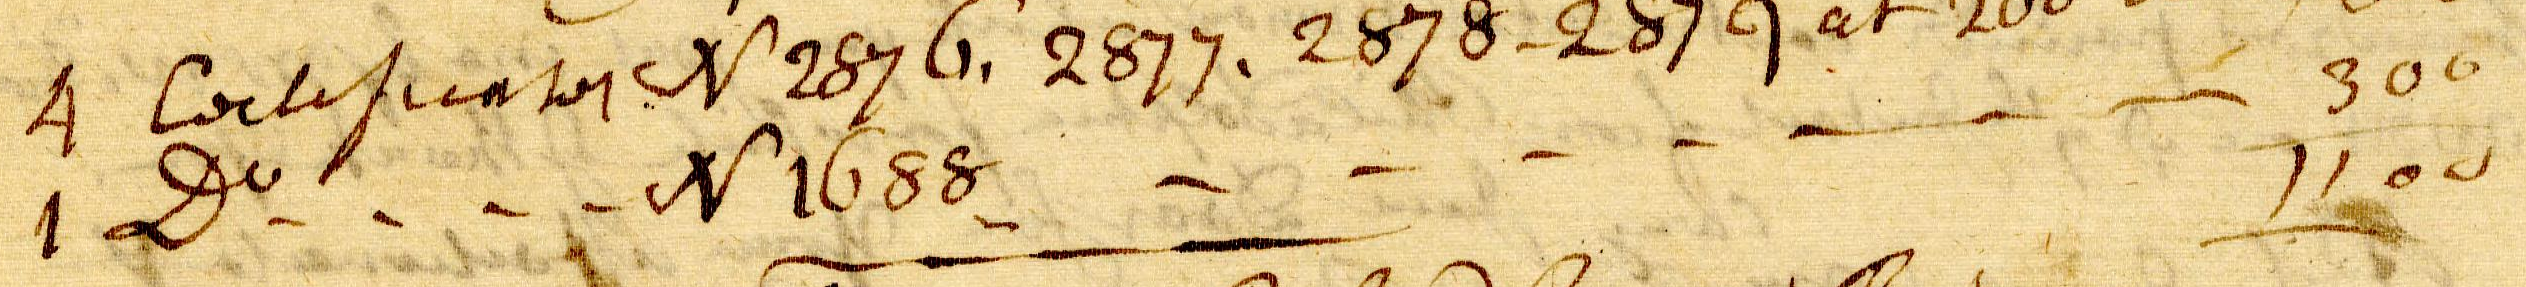1 D^o ----N 1688 --------300
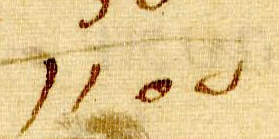1100
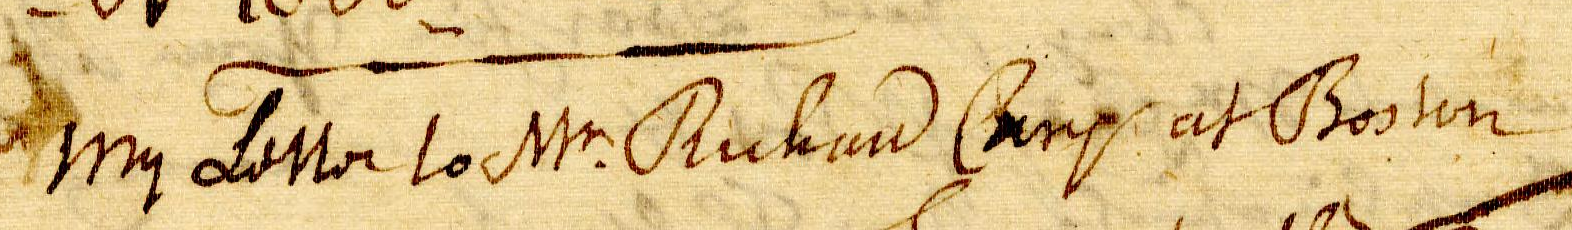My Letter to Mr. Richard Cary at Boston
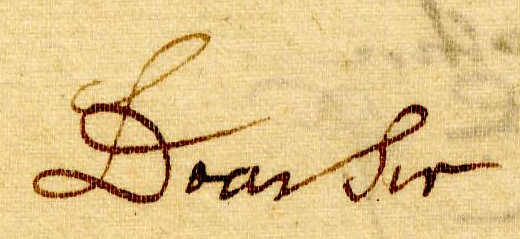Dear Sir
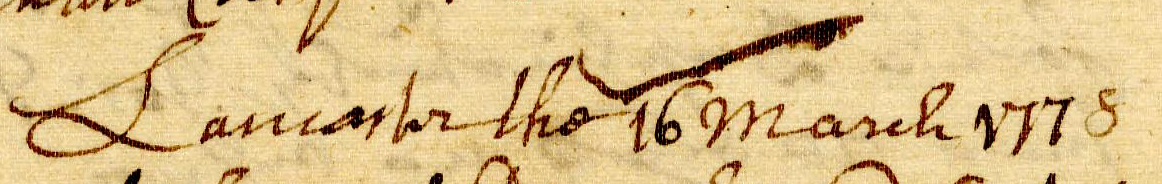Lancaster the 16 March 1778
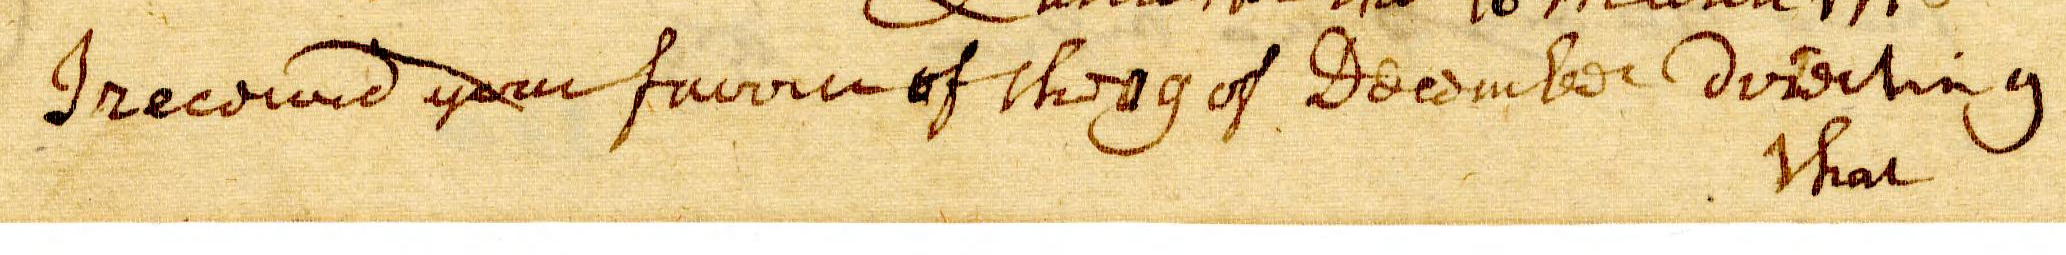I received your favour of the 19 of December directing
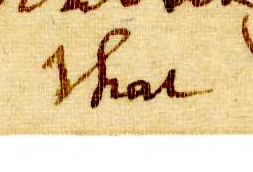that
